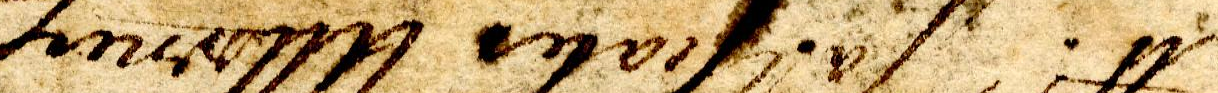M^r Ja. Yeates Attorney
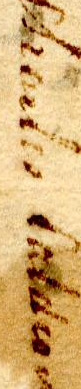Charles Caldwell
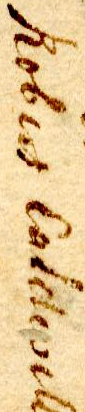Robet Caldwell
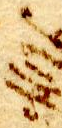Plff's
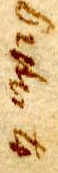Order to
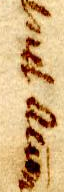end Action
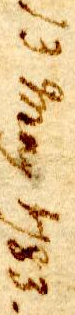13 May 1783.
